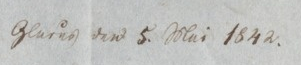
Glarus den 5. Mai 1842.
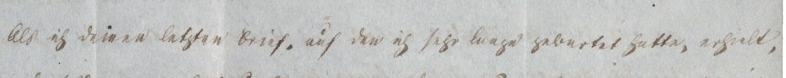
Als ich deinen letzten Brief, auf den ich sehr lange gewartet hatte, erhielt,
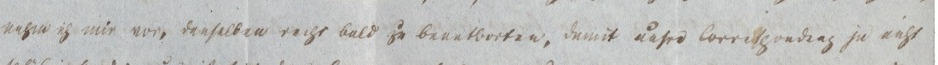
nahm ich mir vor, denselben recht bald zu beantworten, damit unsre Correspondenz ja nicht
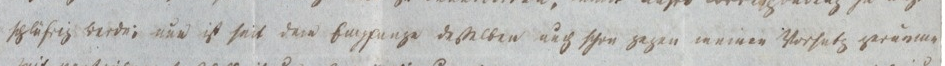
schläfrig werde; nun ist seit dem Empfange desselben auch schon gegen meinen Vorsatz geraume
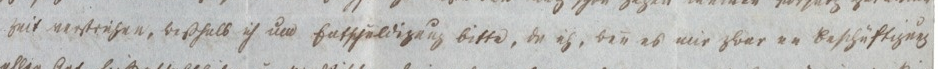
Zeit verstrichen, weßhalb ich um Entschuldigung bitte, da ich, wenn es mir zwar an Beschäftigung
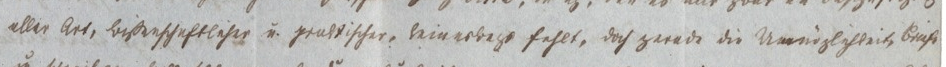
aller Art, wissenschaftlicher u. praktischer, keineswegs fehlt, doch gerade die Unmöglichkeit, Briefe
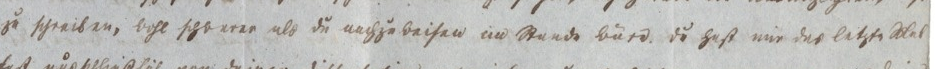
zu schreiben, wohl schwerer als du nachzuweisen im Stande wäre. Du hast mir das letzte Mal
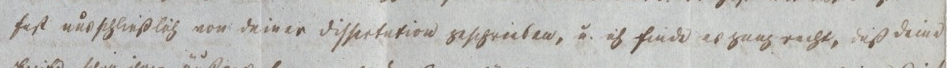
fast ausschließlich von deiner Dissertation geschrieben, u. ich finde es ganz recht, daß deine
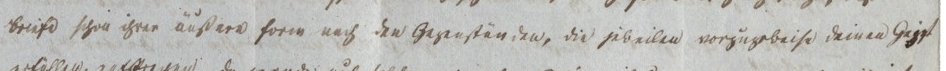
Briefe schon ihrer äußern Form nach den Gegenständen, die jeweilen vorzugsweise deinen Geist
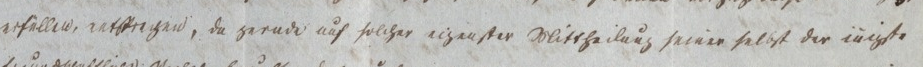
erfüllen, entsprechen, da gerade auf solcher eigenster Mittheilung seiner selbst der innigste
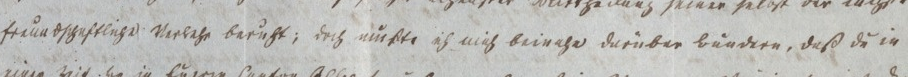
freundschaftliche Verkehr beruht; doch mußte ich mich beinahe darüber wundern, daß du in
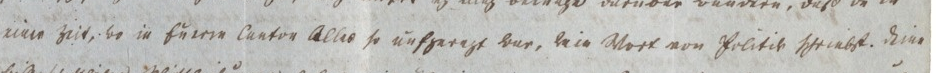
einer Zeit, wo in Euerm Canton Alles so aufgeregt war, kein Wort von Politik schriebst. Deine
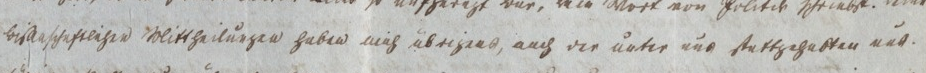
wissenschaftlichen Mittheilungen haben mich übrigens, nach der unter uns stattgehabten aus-
